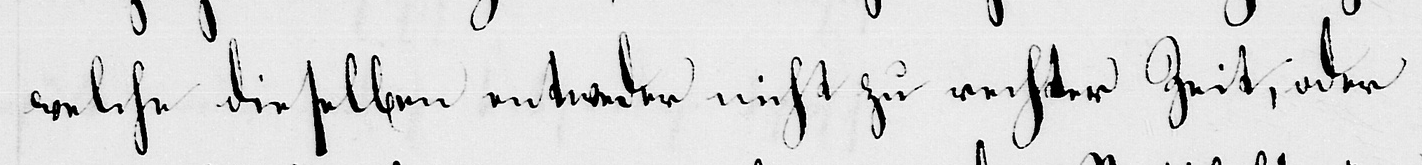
welche dieselben entweder nicht zu rechter Zeit, oder
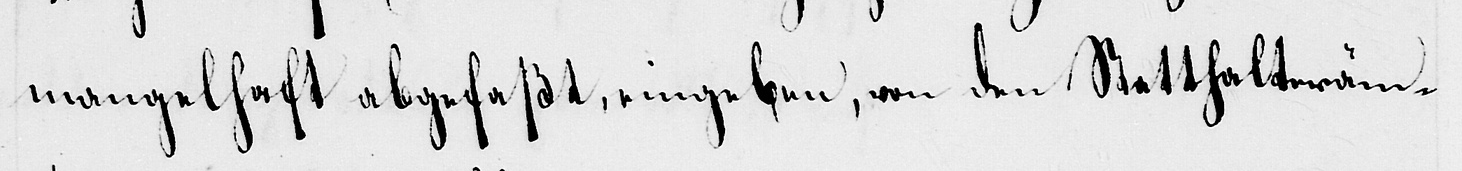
mangelhaft abgefaßt, eingeben, von den Statthalteräm¬
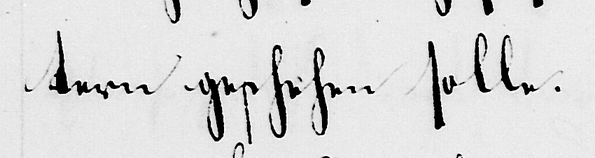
tern geschehen solle.
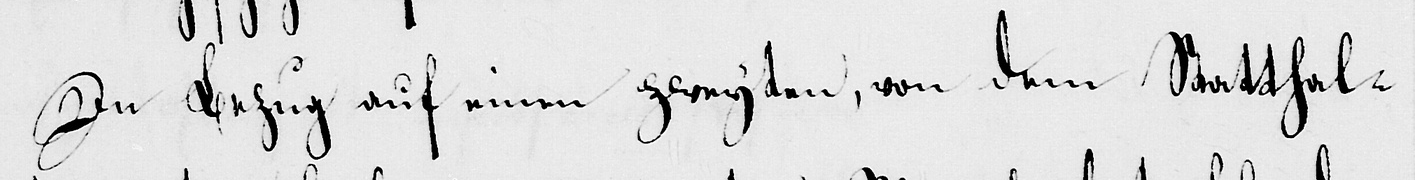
In Bezug auf einen zweyten, von dem Statthal¬
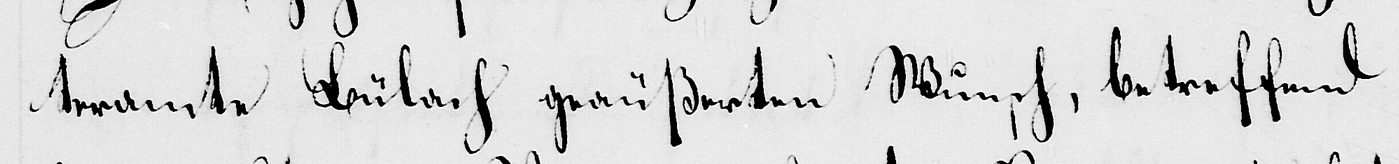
teramte Bülach geäußerten Wunsch, betreffend
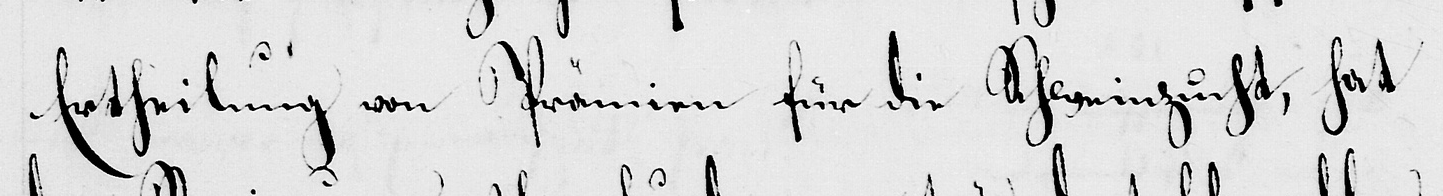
Ertheilung von Prämien für die Schweinzucht, hat
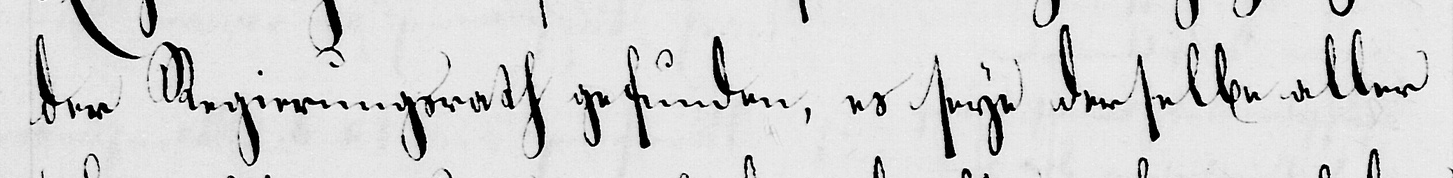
der Regierungsrath gefunden, es seye derselbe aller
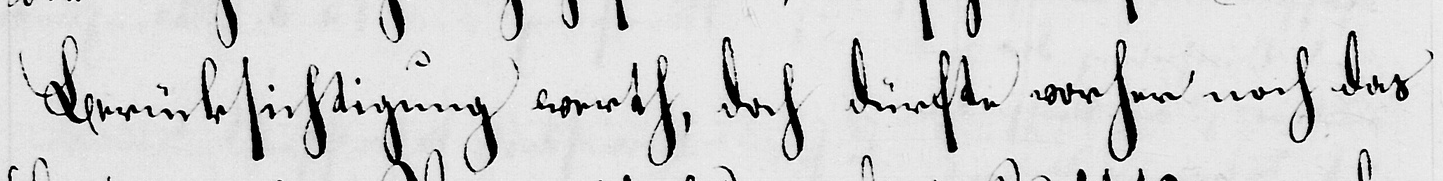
Berücksichtigung werth, doch dürfte vorher noch das
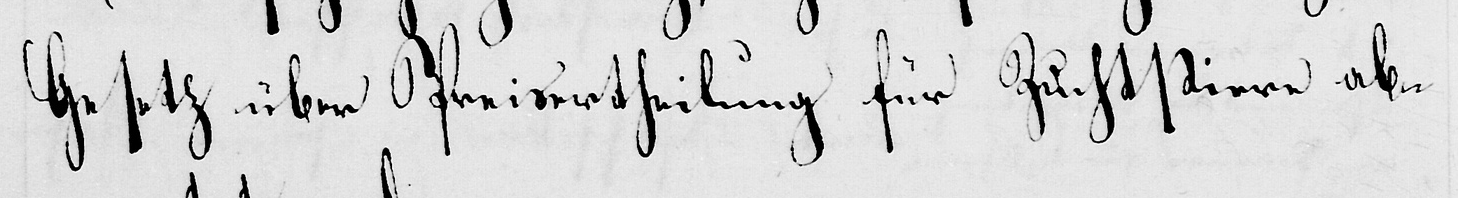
Gesetz über Preisertheilung für Zuchtstiere ab¬
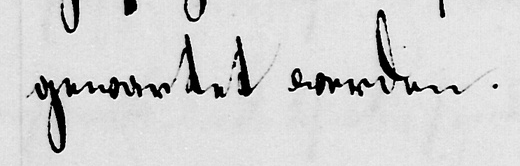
gewartet werden.
